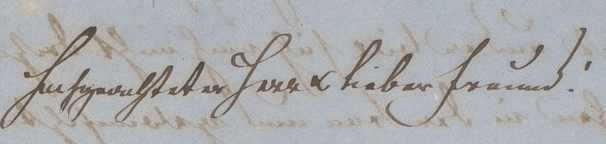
Hochgeachteter Herr & lieber
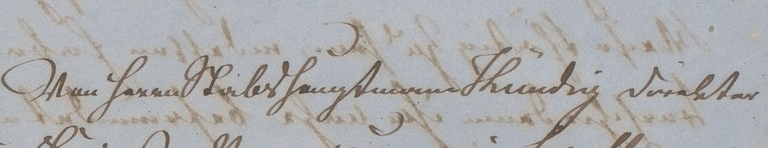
Von Herrn Stabshauptmann Kündig Direktor
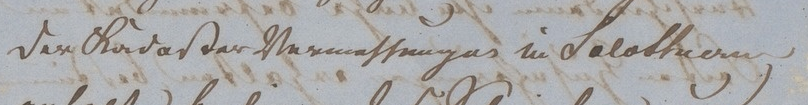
der Kadaster Vermessungen in Solothurn
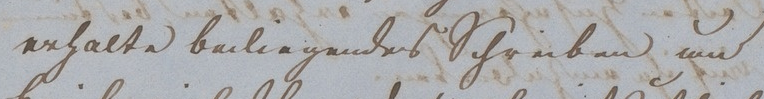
erhalte beiliegendes Schreiben und
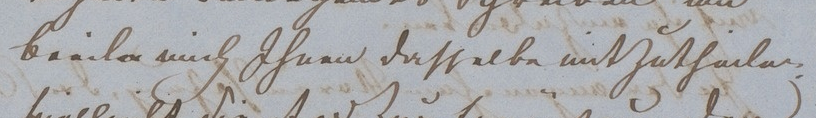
beeile mich Ihnen dasselbe mitzutheilen:
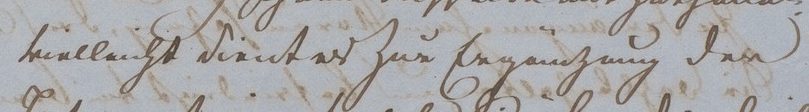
Vielleicht dient es zur Ergänzung der
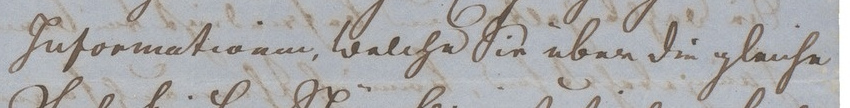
Informationen, welche Sie über die gleiche
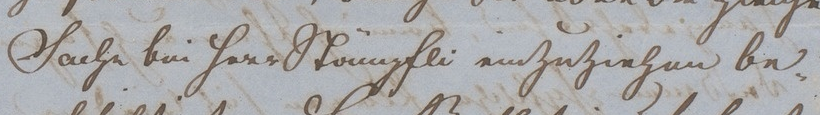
Sache bei Herr Stämpfli einzuziehen be-
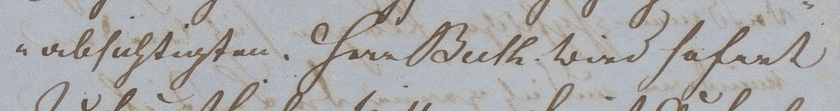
absichtigten. Herr Beckh wird sofort
